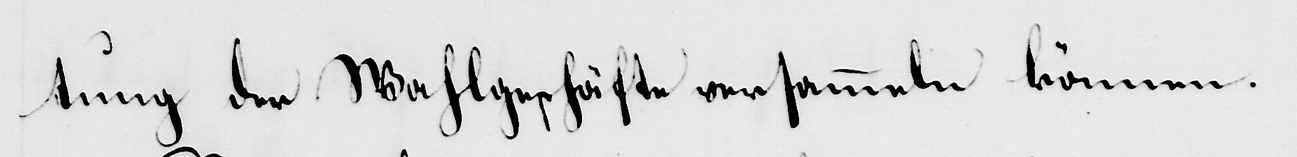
tung der Wahlgeschäfte versammeln können.
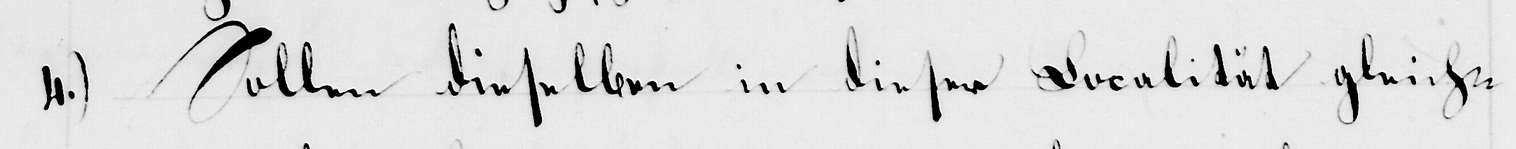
4.) Sollen dieselben in dieser Localität gleich¬
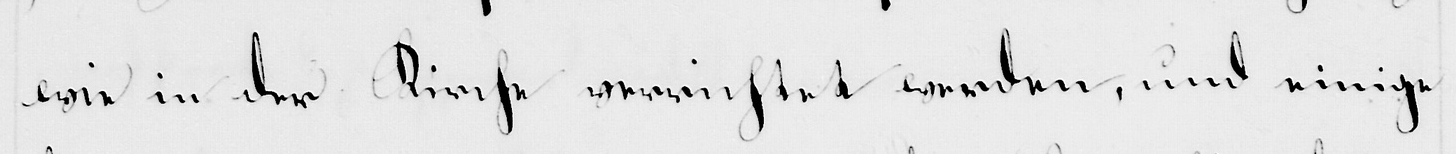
wie in der Kirche verrichtet werden, und einige
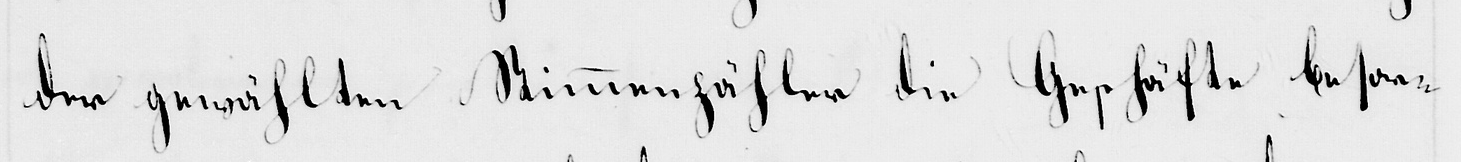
den gewählten Stimmenzähler die Geschäfte besor¬
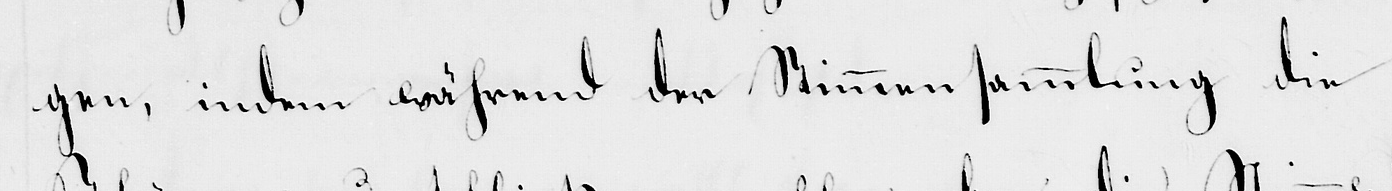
gen, indem während der Stimmensammlung die
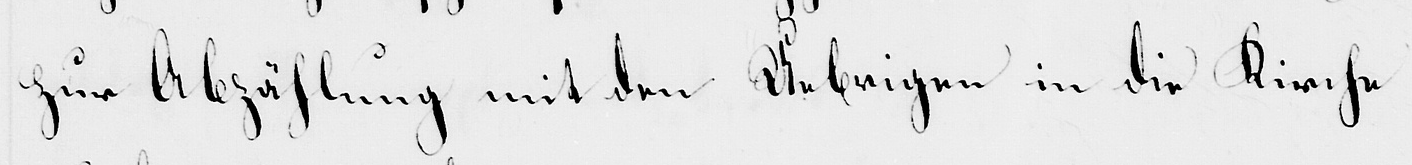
zur Abzählung mit den Uebrigen in die Kirche
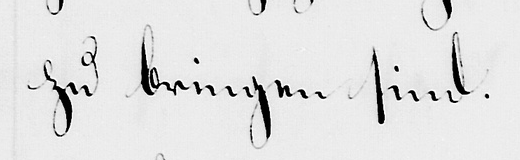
zu bringen sind.
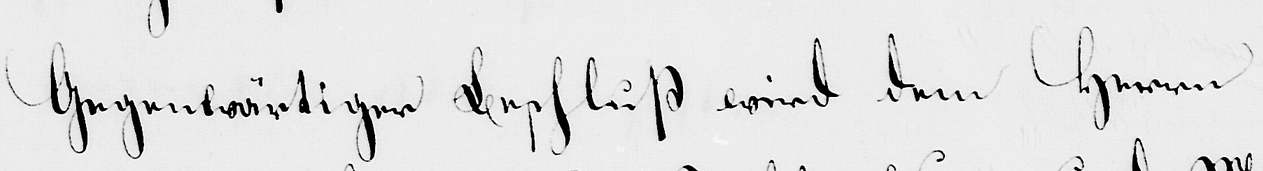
Gegenwärtiger Beschluß wird dem Herrn
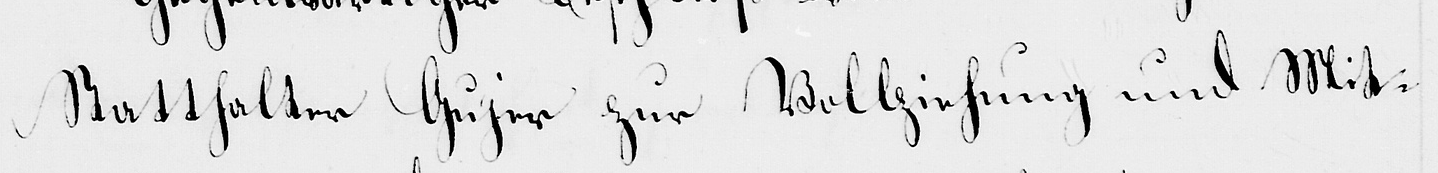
Statthalter Gujer zur Vollziehung und Mit¬
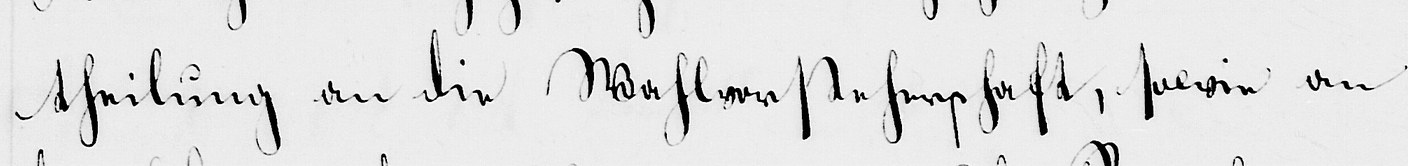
theilung an die Wahlvorsteherschaft, sowie an
